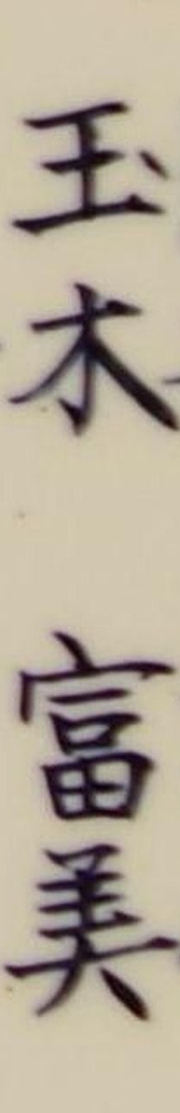玉木富美
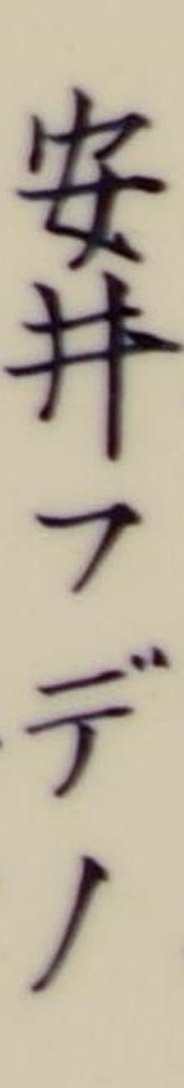安井フデノ
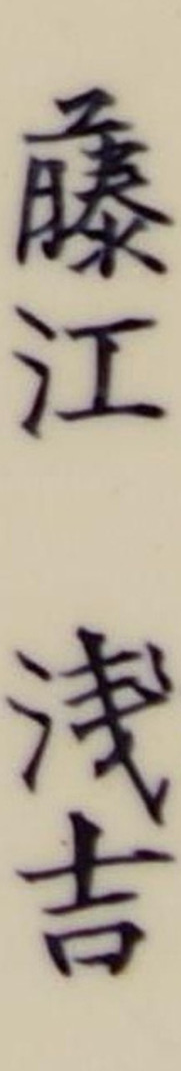藤江浅吉
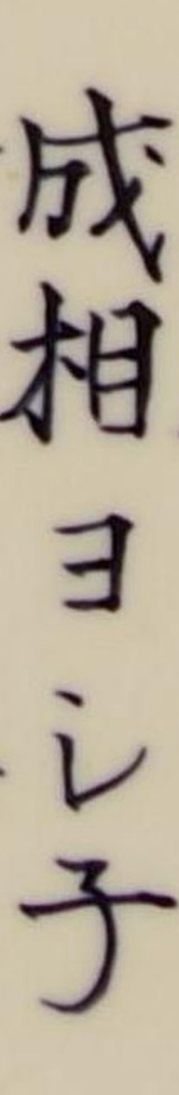成相ヨシ子
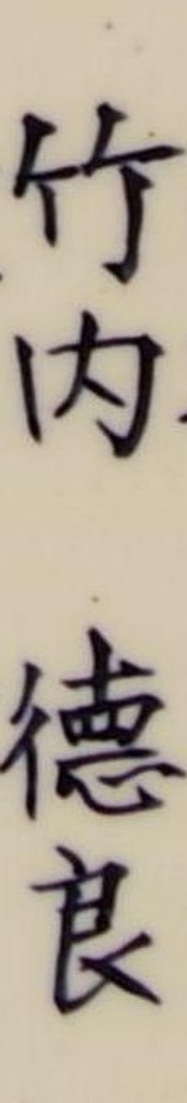竹内徳良
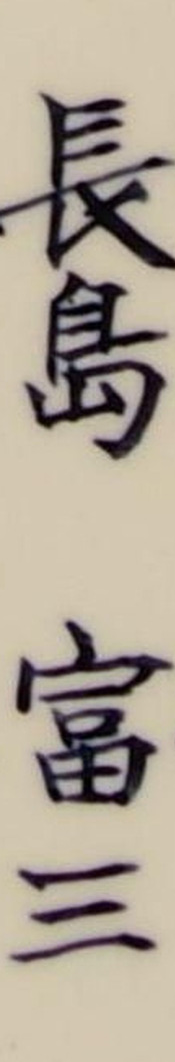長島富三
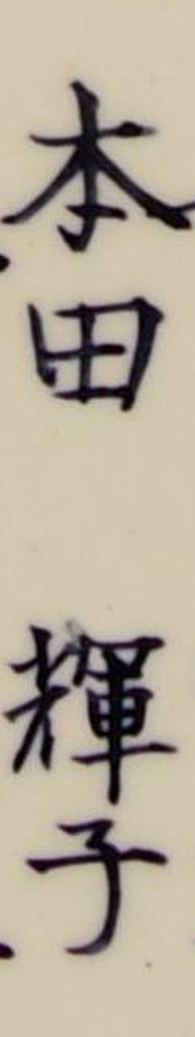本田輝子
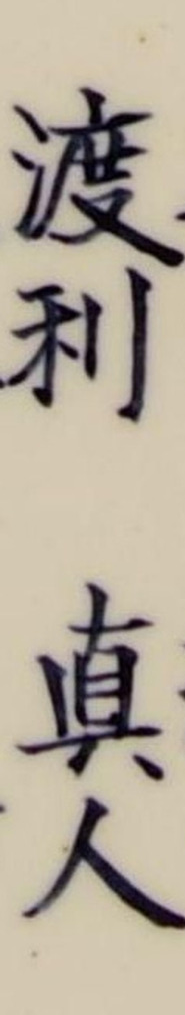渡利真人
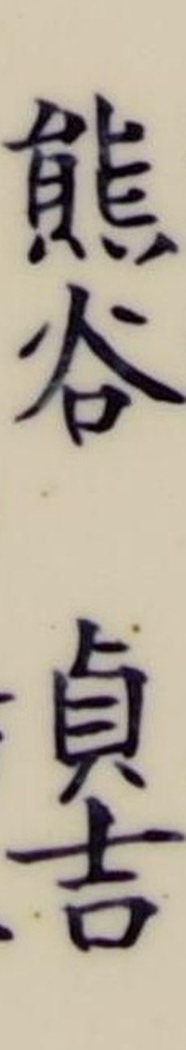熊谷貞吉
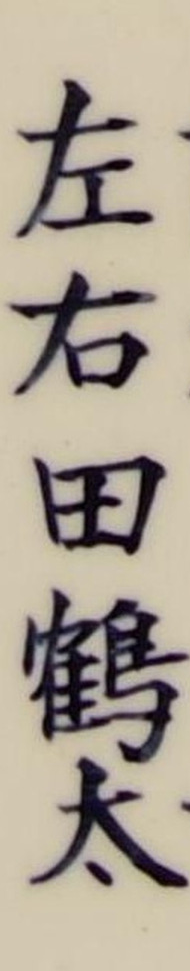左右田鶴太
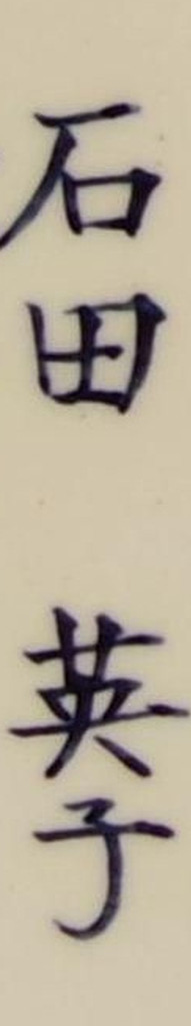石田英子
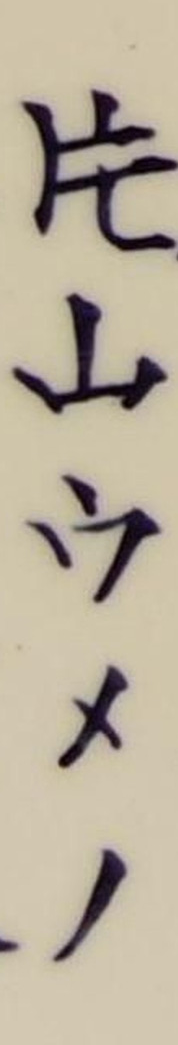片山ウメノ
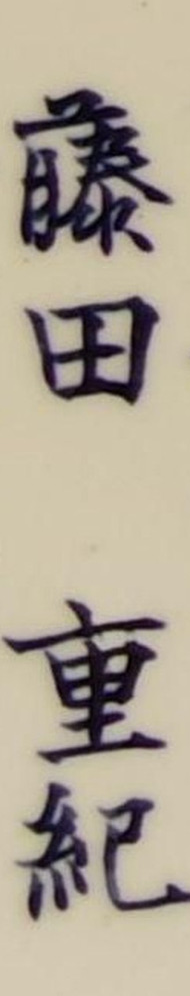藤田重紀
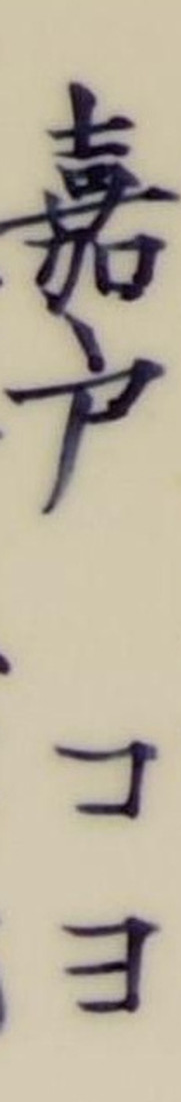嘉戸コヨ
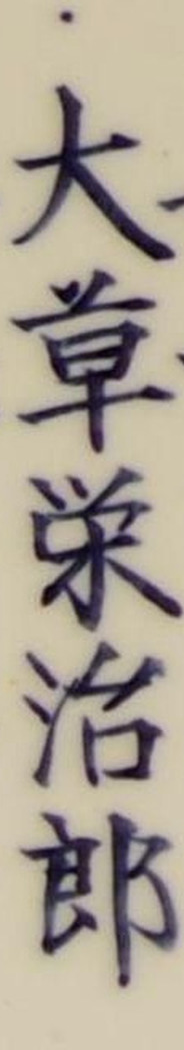大草栄治郎
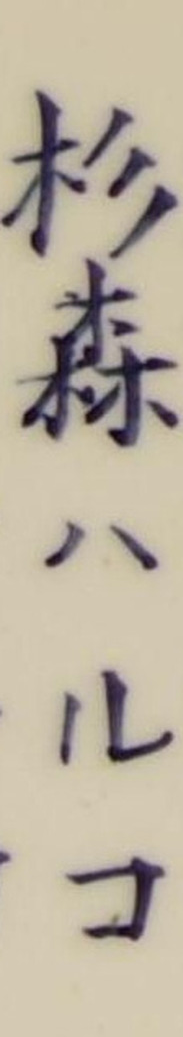杉森ハルコ
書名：E~L
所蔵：高野山金剛峯寺
